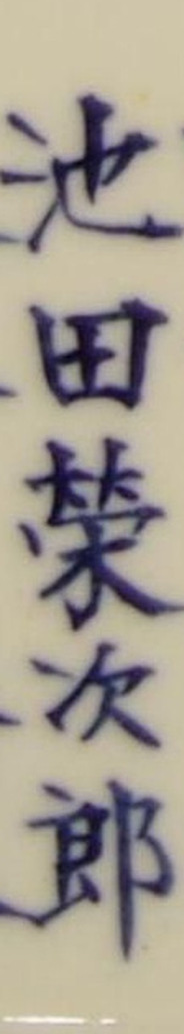池田榮次郎
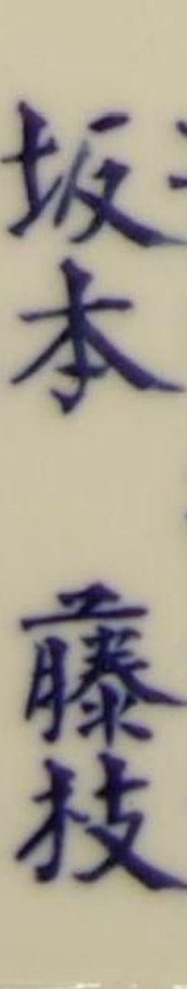坂本藤枝
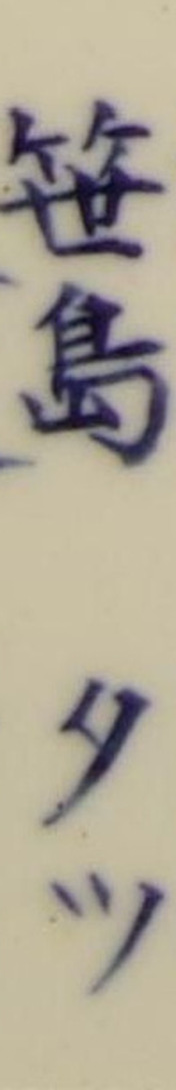笹島タツ
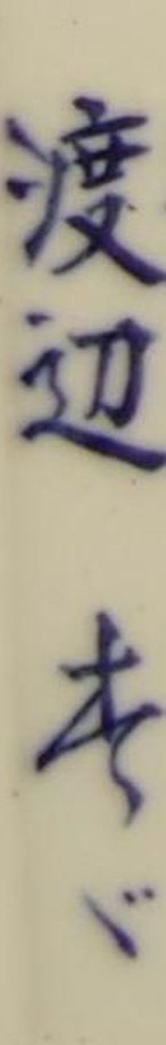渡辺すゞ

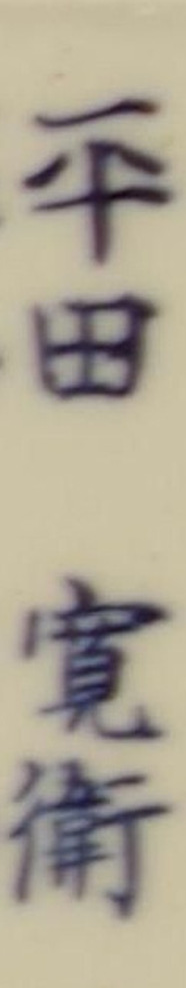平田寛衛
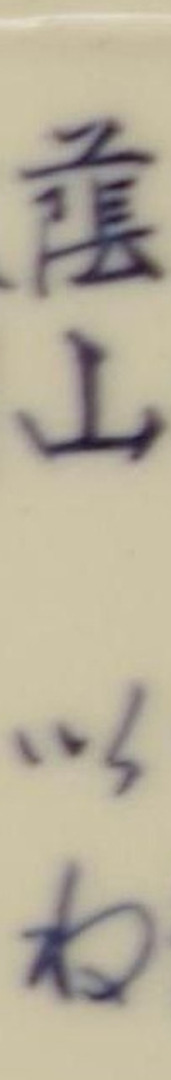蔭山いね
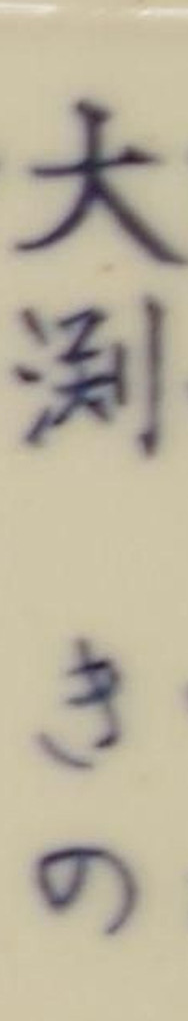大渕きの
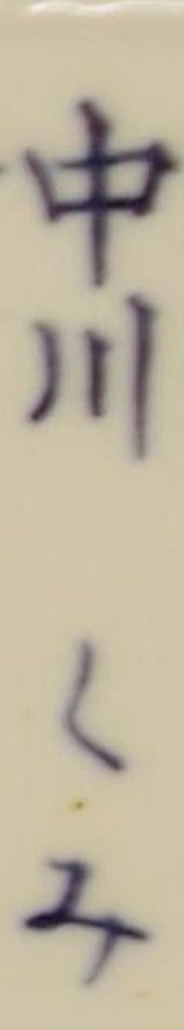中川くみ
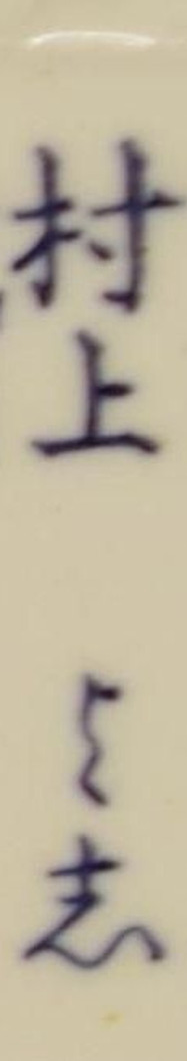村上よし
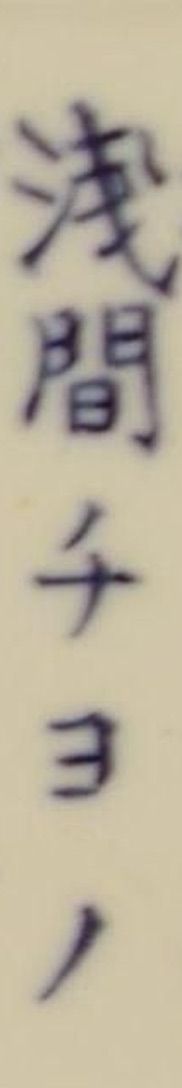浅間チヨノ
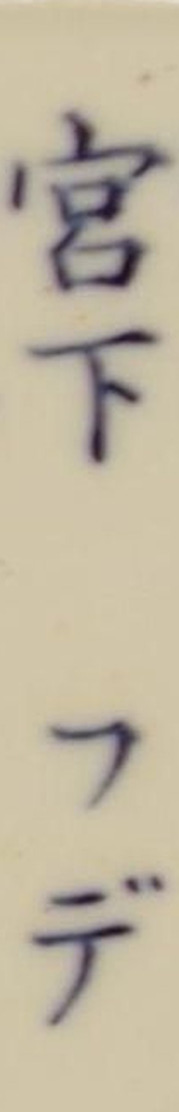宮下フデ
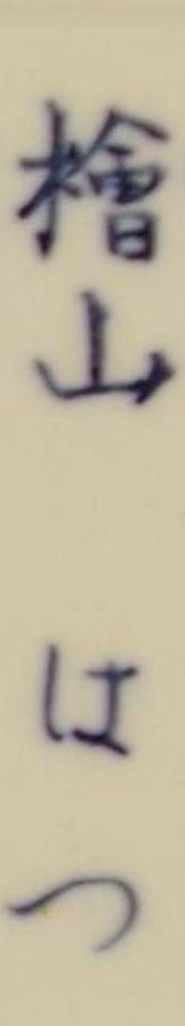檜山はつ
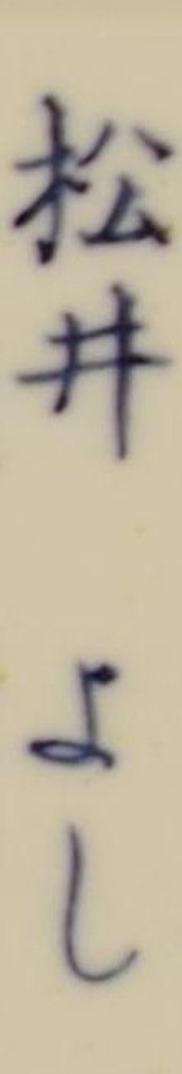松井よし
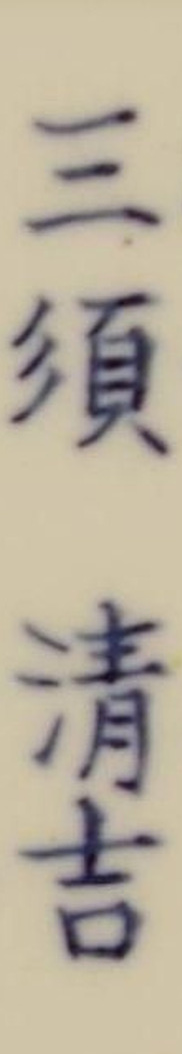三須清吉
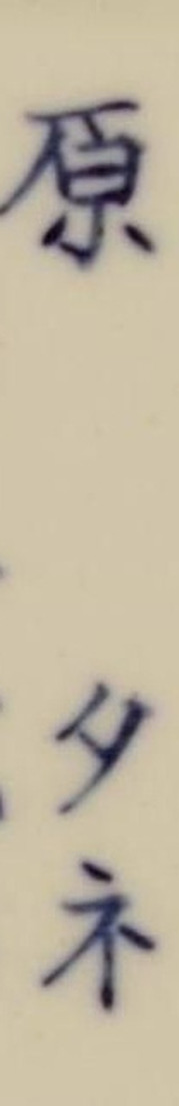原タネ
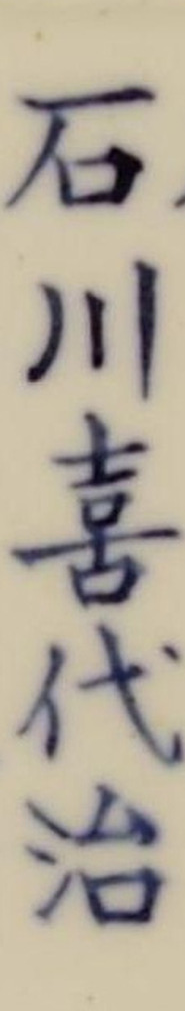石川喜代治
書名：E~L
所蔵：高野山金剛峯寺
